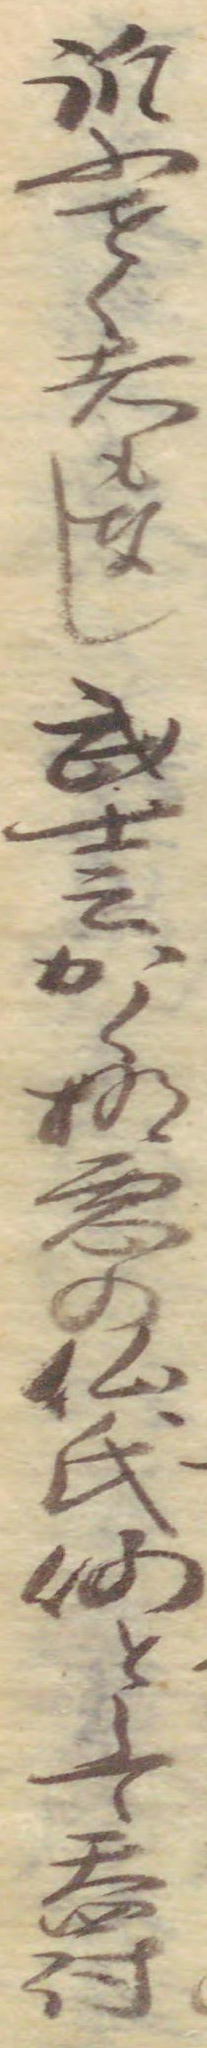誰ふせく者もなし武士云かく極悪の仏氏何として天罰

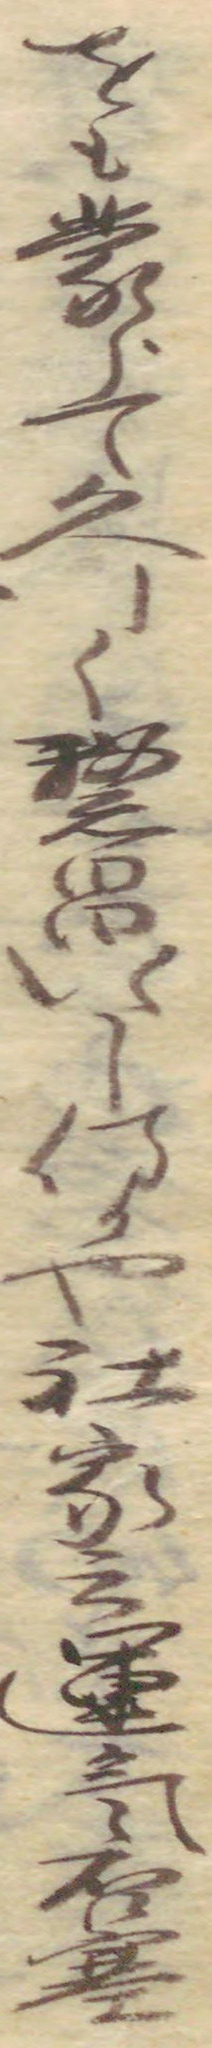をも蒙らて久しく繁昌いたし侍るや社家云運気否塞
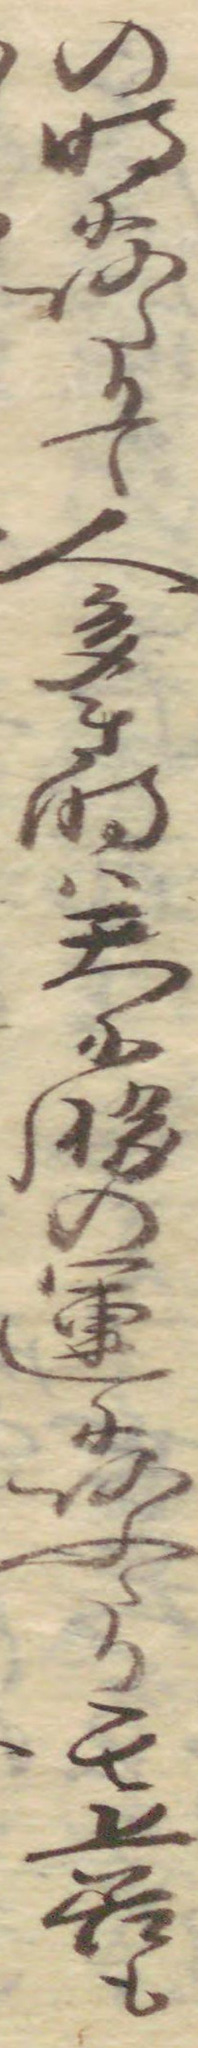の時にあたりて人多き時は天に勝の運にあふたり其上善も
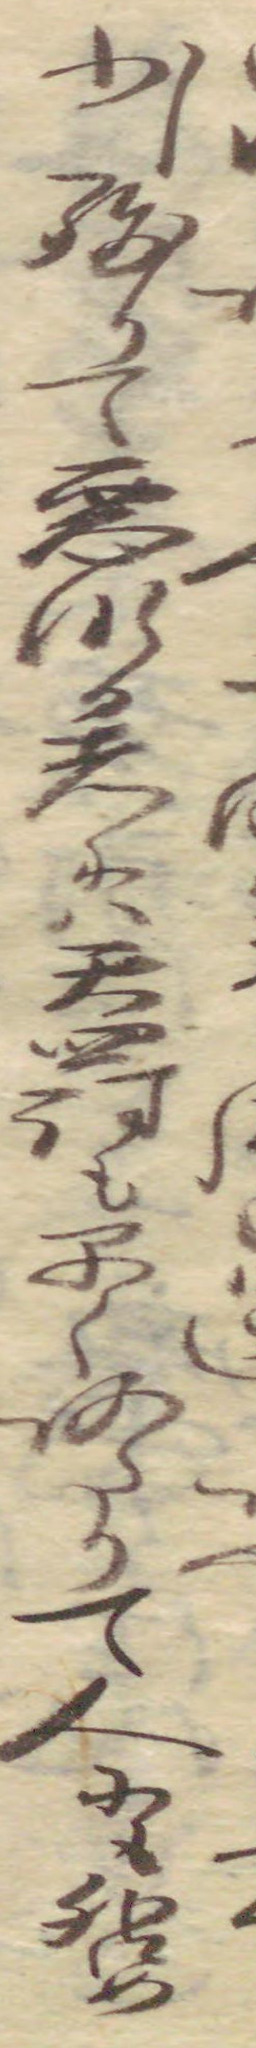少し残りて悪なる者には天罰も早くあたりて人にも咎め
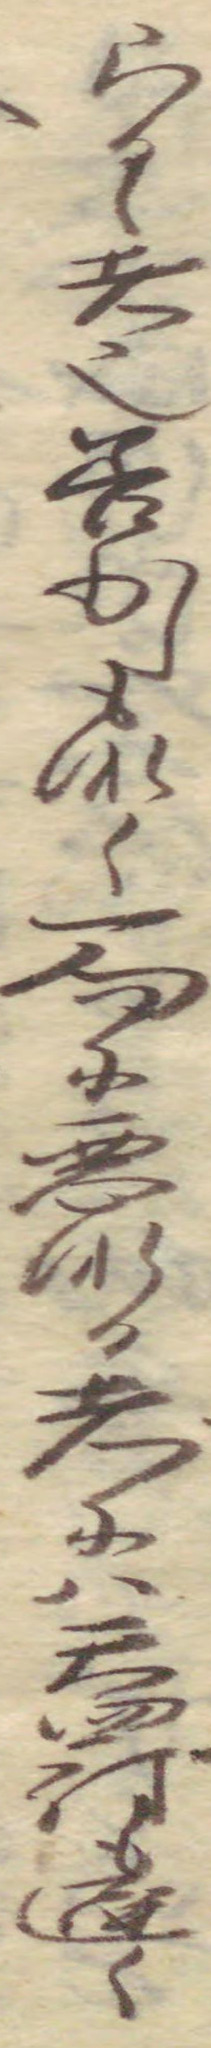らるゝ者也善少しもなく一向に悪なる者には天罰も遅く
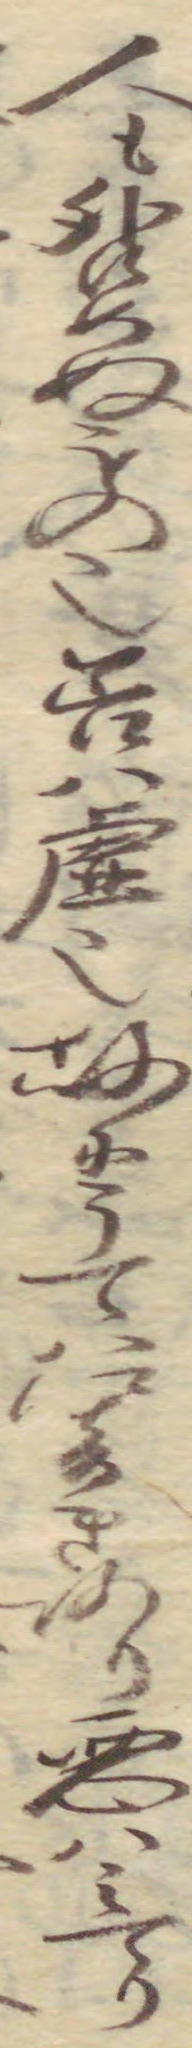人も咎めぬもの也善は虚也故にうては響きあり悪はみてり
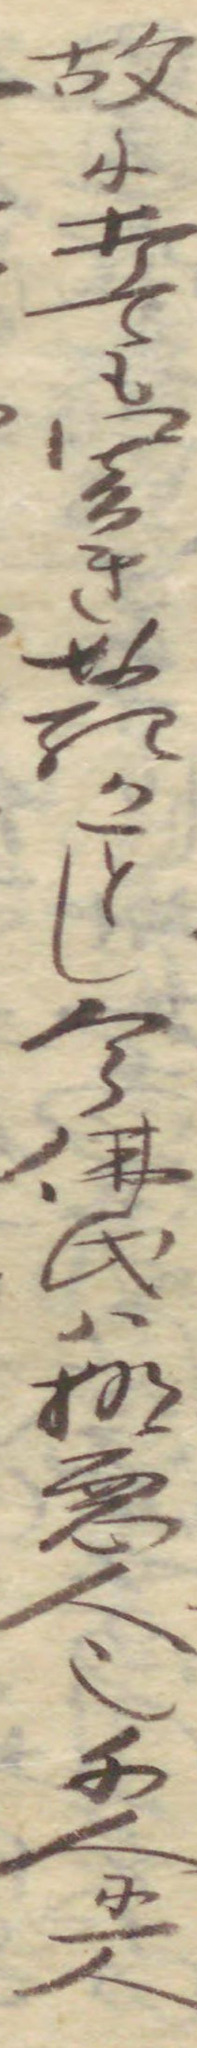故に打ても響きなきかことし今仏氏は極悪人也千人に一人
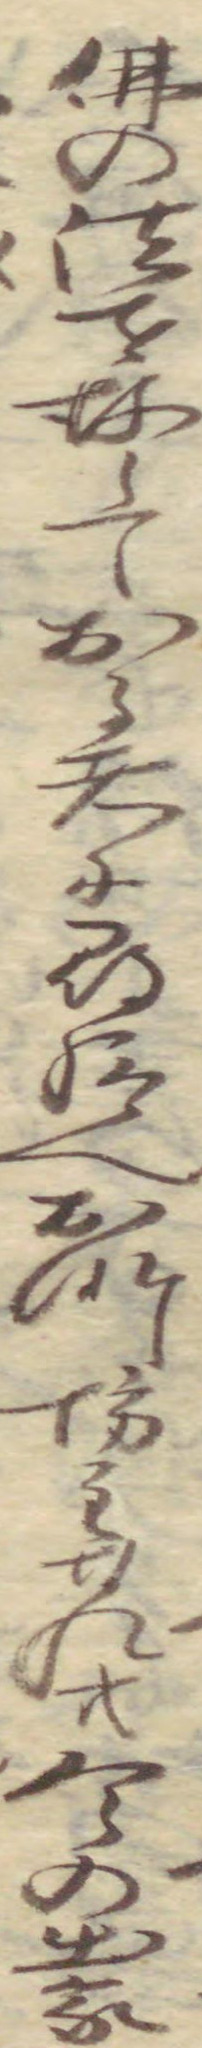仏の法を致しておる者に尋給へおなし坊主なれ共今の出家
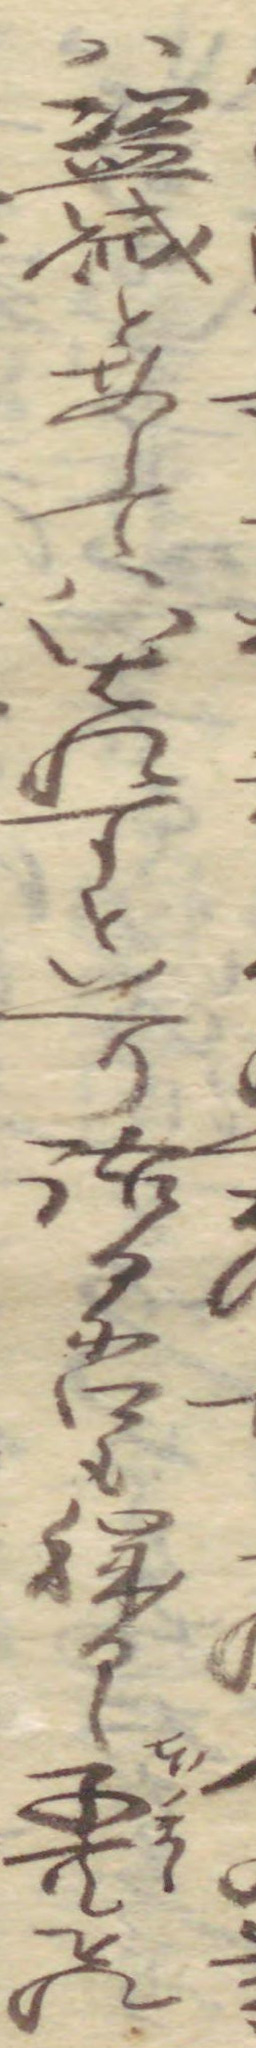は盗賊とならてはいはれすといへり語るに口も穢るゝ子共それ
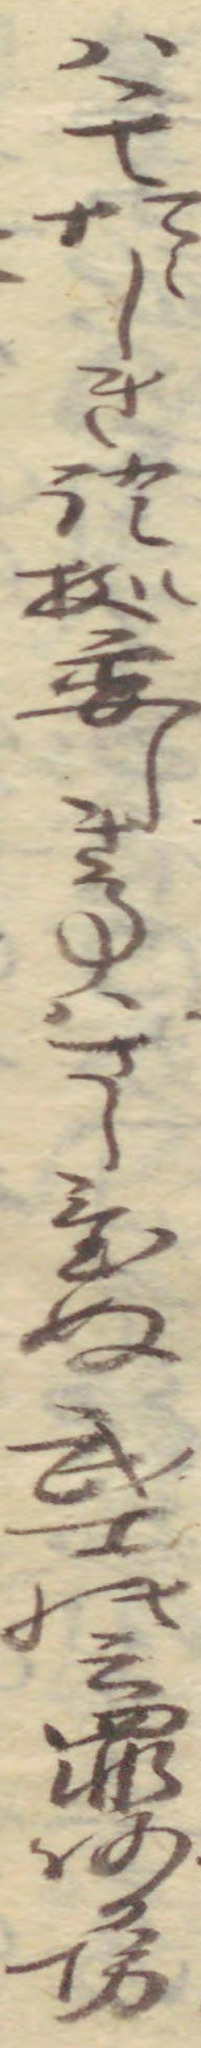は其たゝしき証拠委しき事はさし置ぬ武士の云罪ある坊
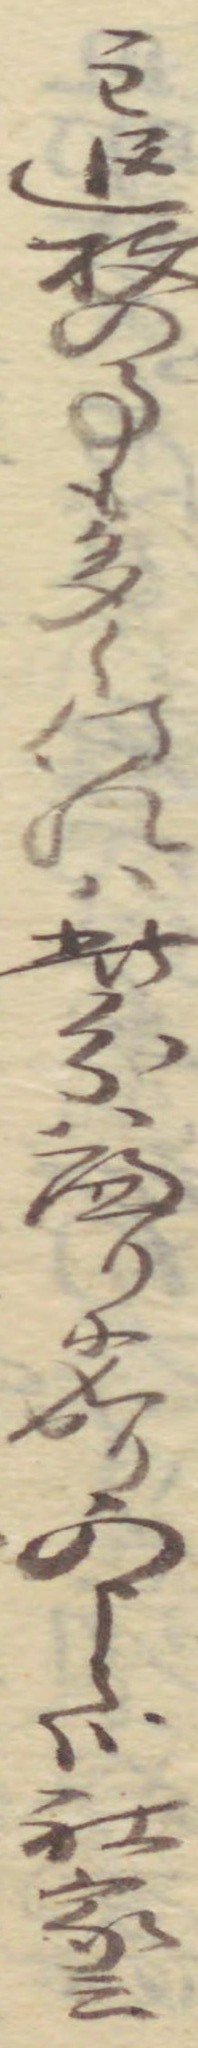主追放の事も多く侍れは此分はへりに成り可申候哉社家云
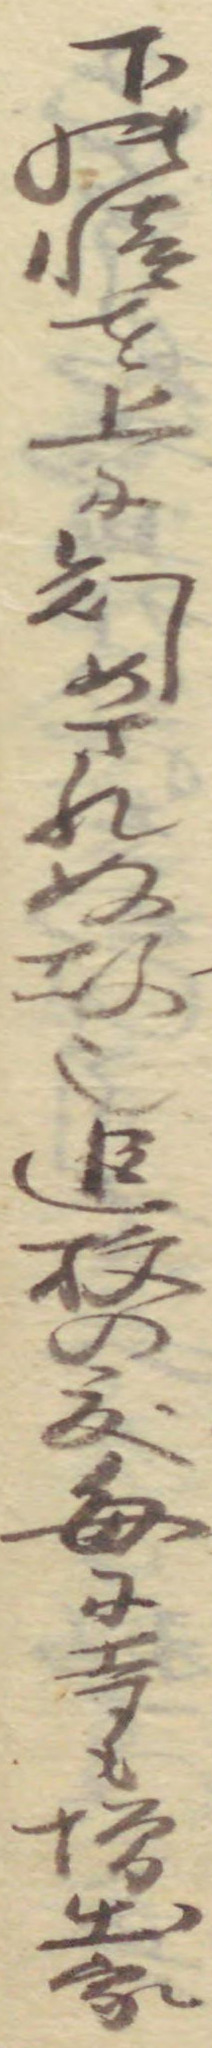下の情を上に知しめされぬ故也追放の度毎に寺も増出家
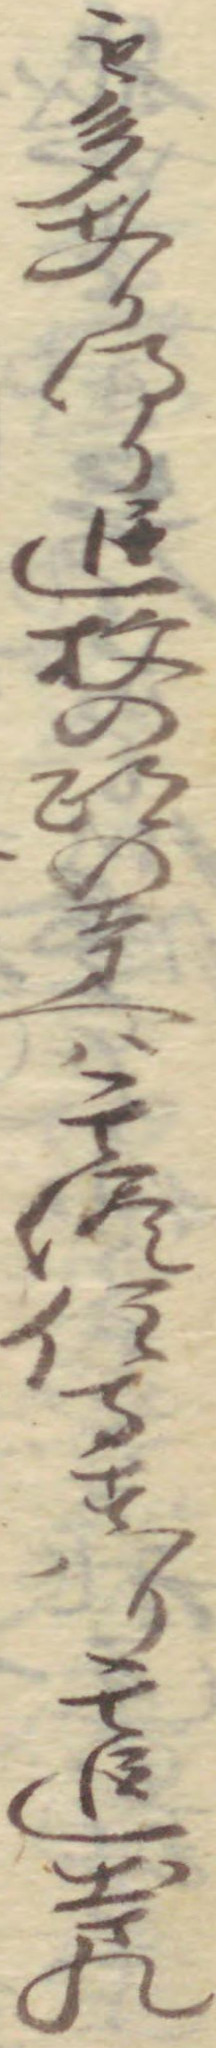も多なり侍り追放の跡の寺へは其侭住寺すはり其追出され
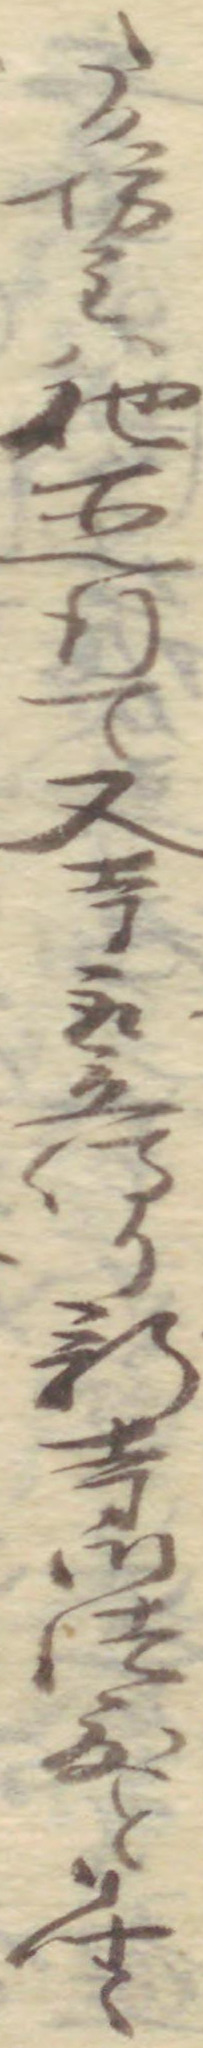たる坊主は他所行て又寺取立侍り新寺御法度と御座候
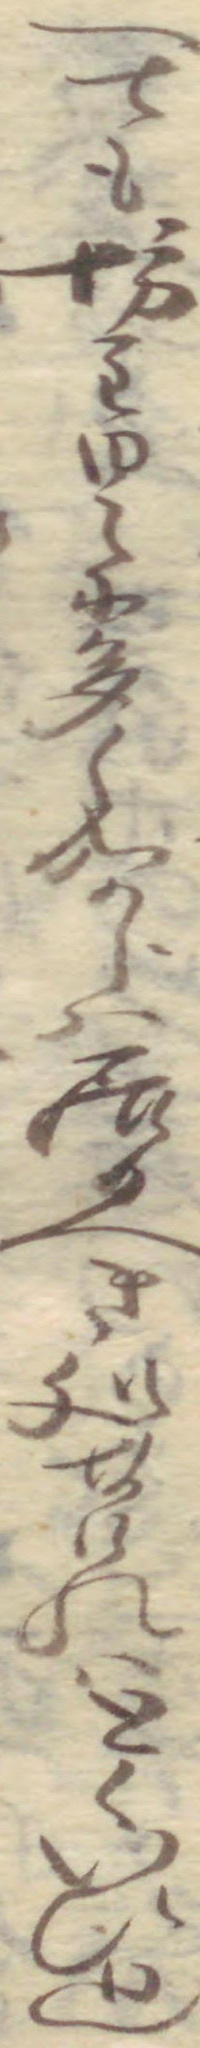へても坊主日〻に多く成り申は居るへき処なけれはとくいひ廻
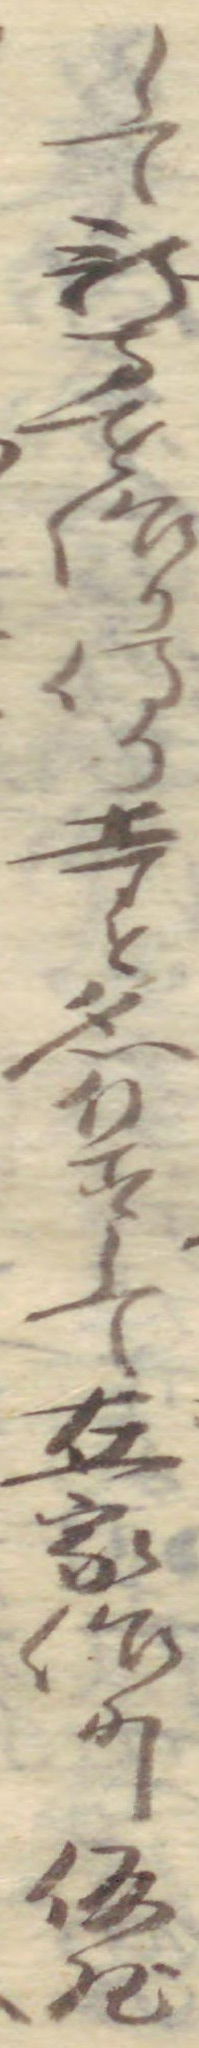して新寺を作り侍り寺と名付すして在家作にし仮屋
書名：鶯宿雑記. 巻263-264
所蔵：国立国会図書館 National Diet Library, JAPAN
